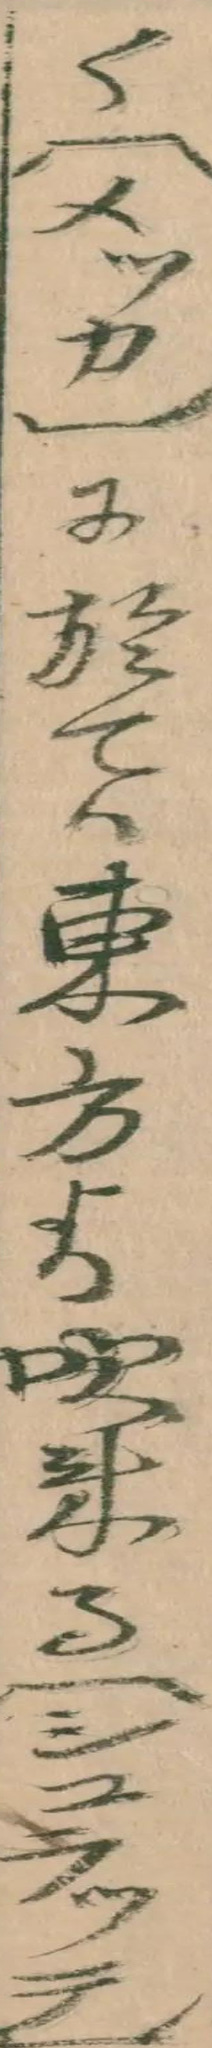く(メッカ)に於ては東方より吹来る(シュラッテ)
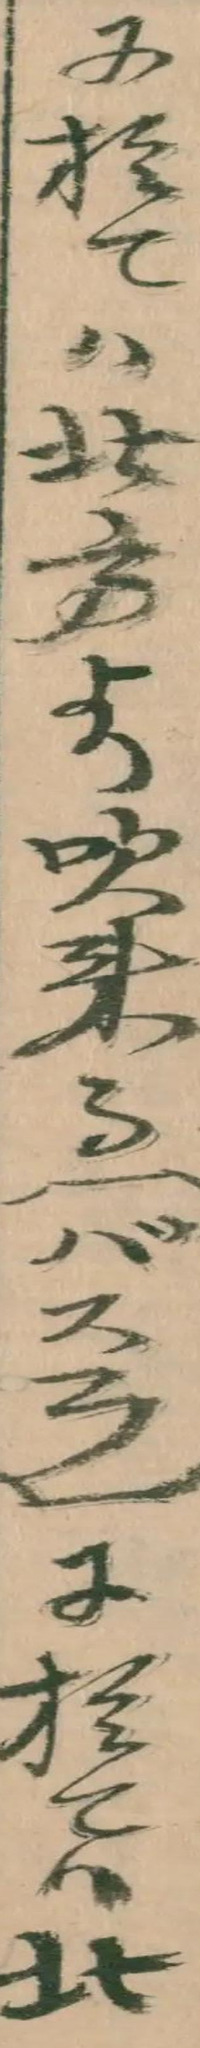に於ては北方より吹来る(パスラ)に於ては北
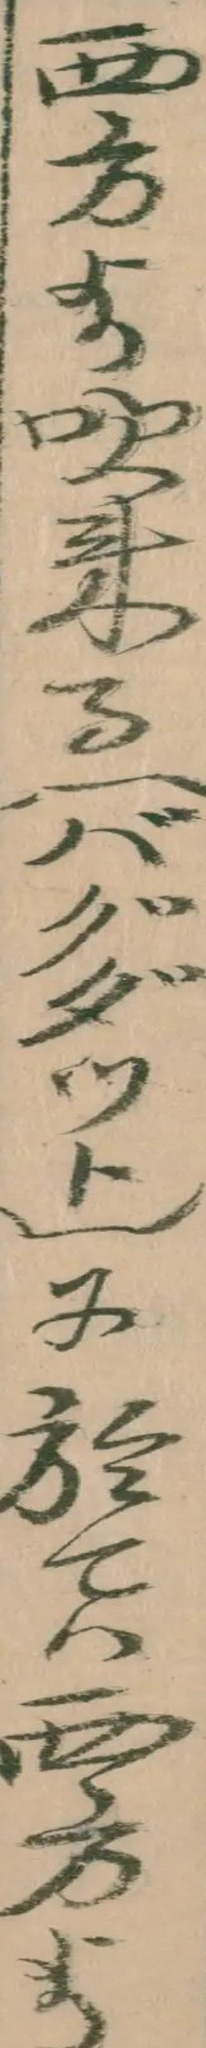西方より吹来る(バグダツト)に於ては西方より
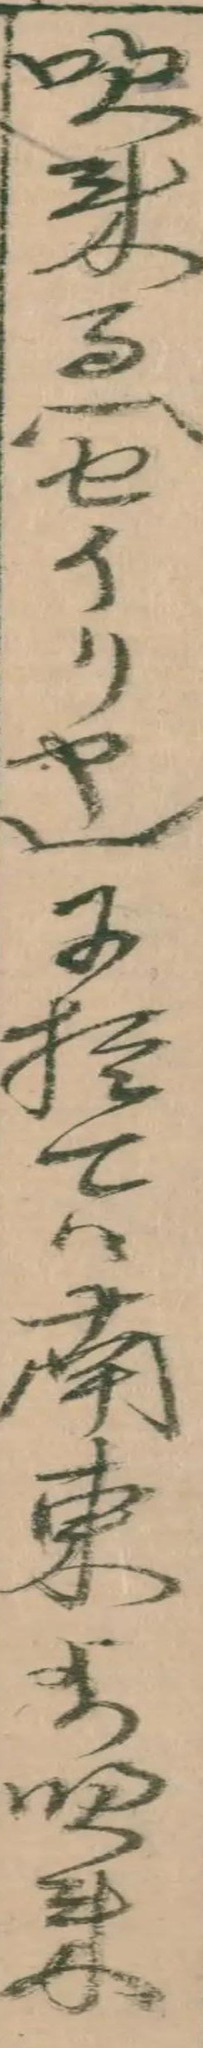吹来る(セイリヤ)に於ては南東より吹来
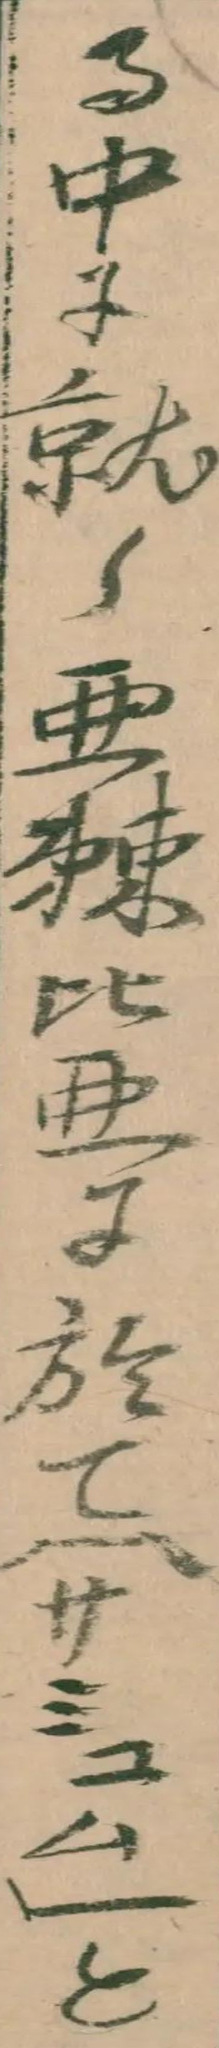る中に就く亜棘比亜に於て(サミュム)と
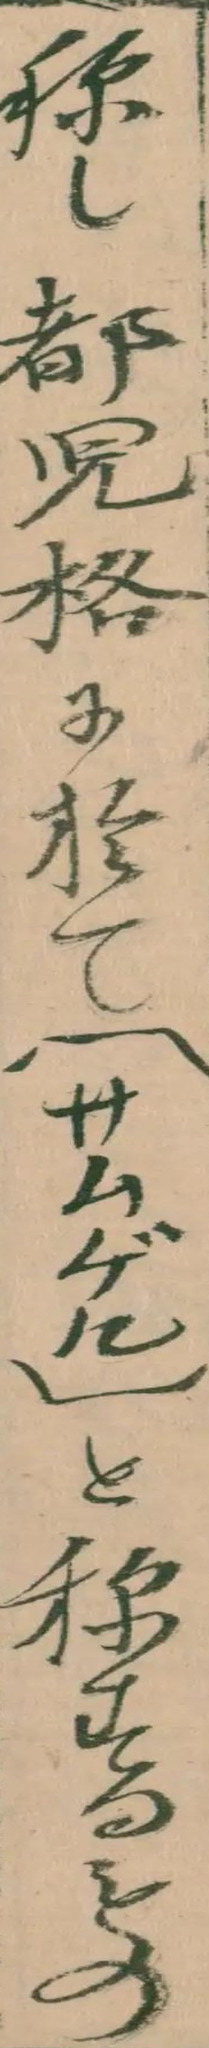称し都児格に於て(サムゲル)と称するもの
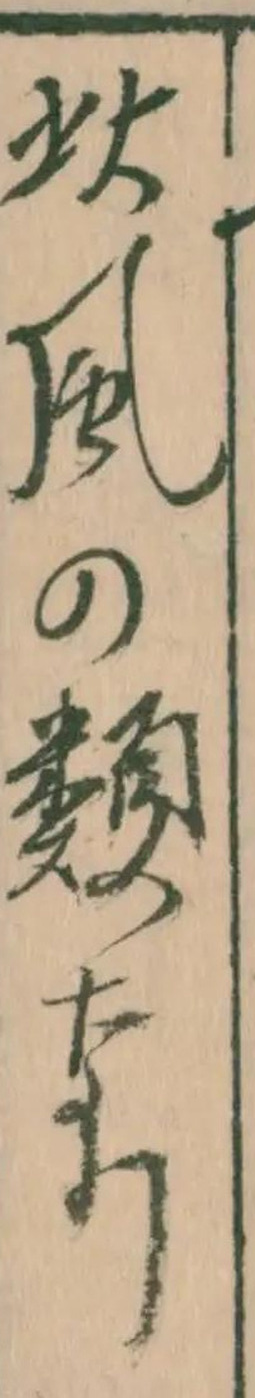此風の類なり
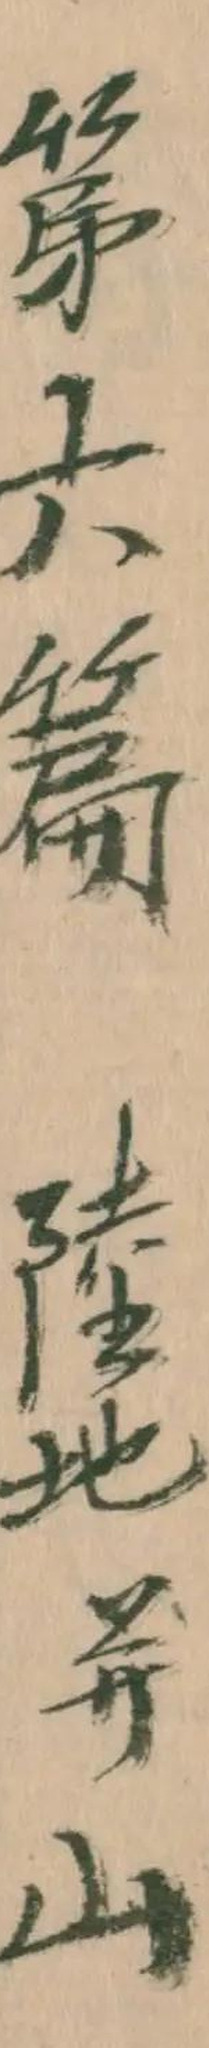第六篇陸地并山
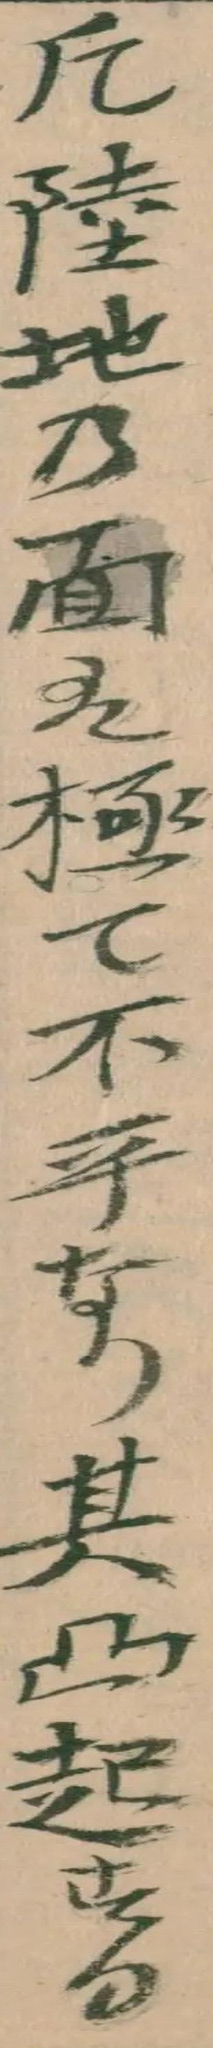凡陸地の面は極て不平なり其凸起する
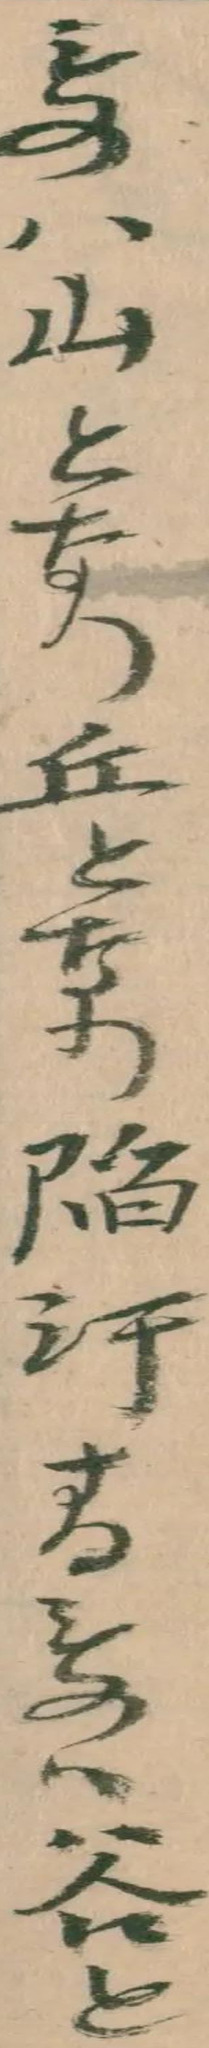ものは山となり丘となり陥汙するものは谷と
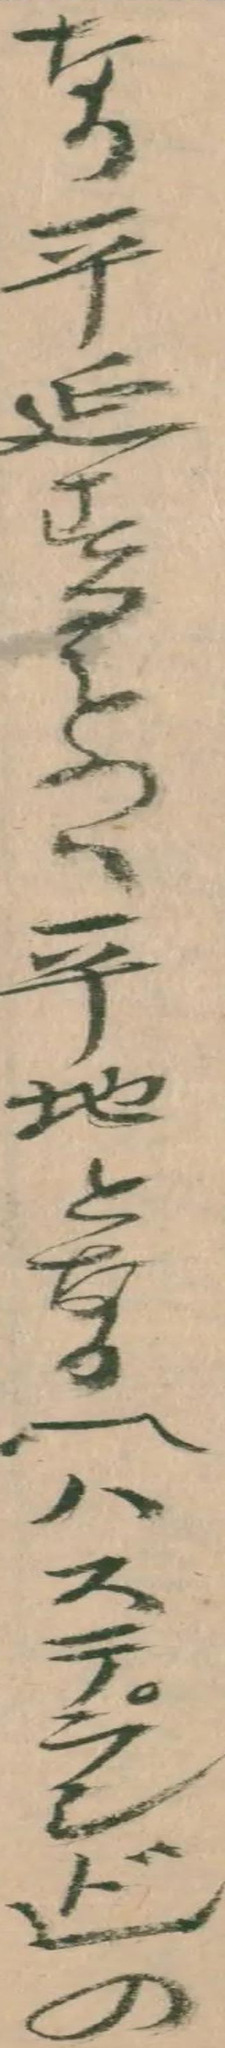なり平延するものは平地となる(ハステ・ランド)の
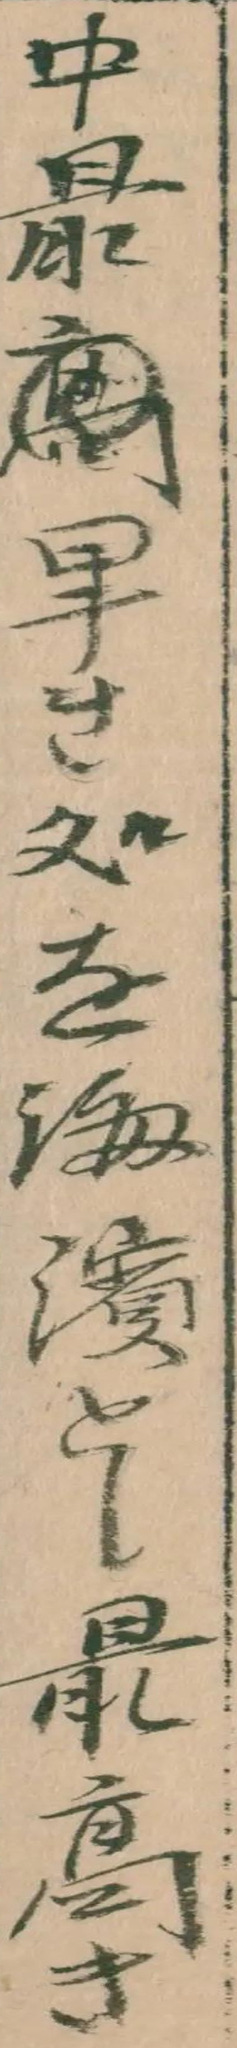中最卑き処を海浜とし最高き
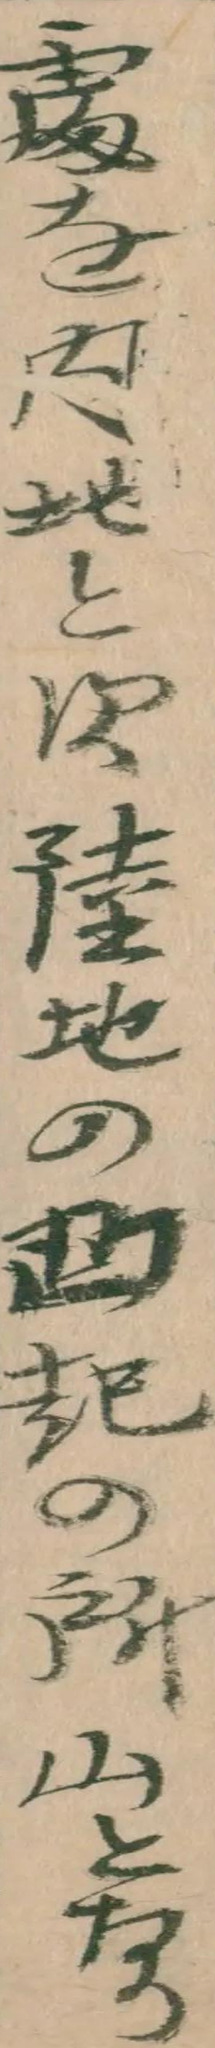処を内地とす陸地の凸起の所山となり
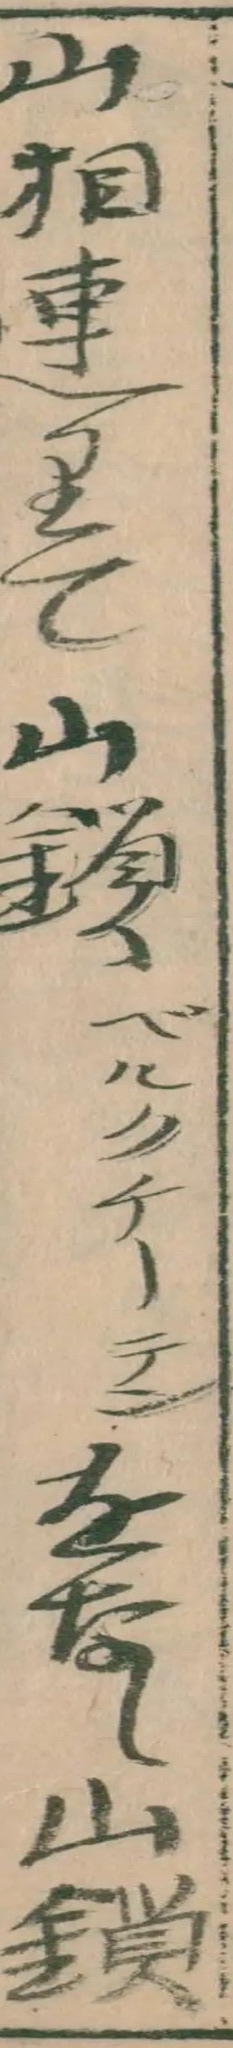山相連りて山鎖ベルクケーテンをなし山鎖

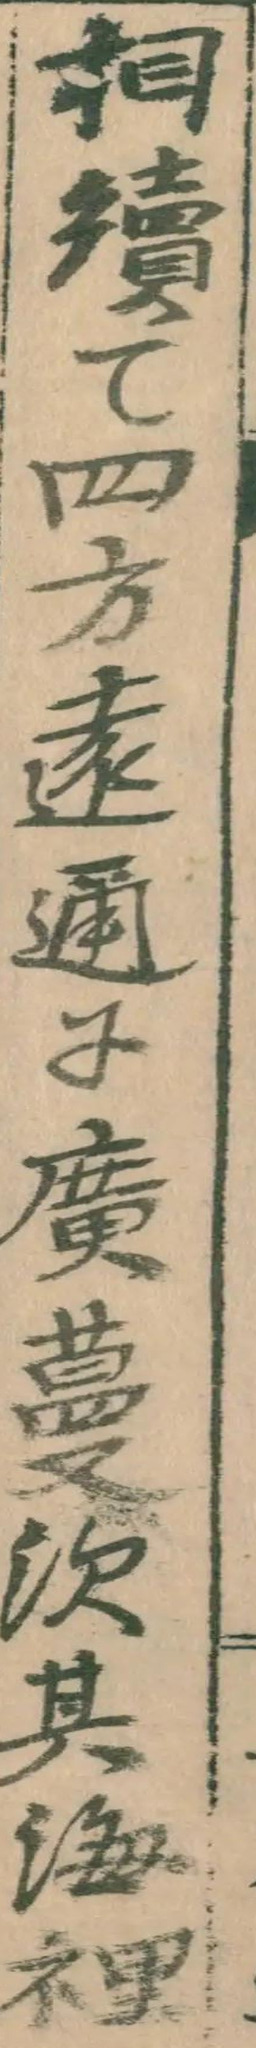相続て四方遠邇に広蔓す其海裡
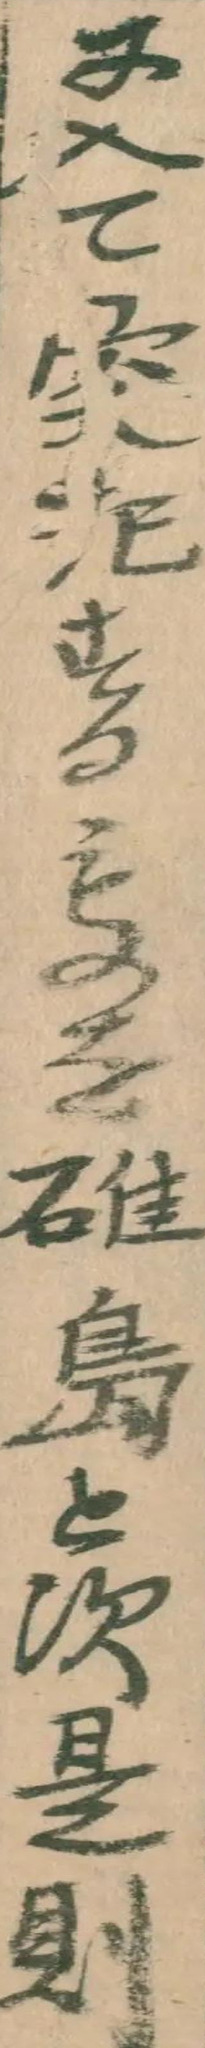に入て突起するものを碓島とす是則
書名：新釈輿地図説
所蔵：国立国会図書館 National Diet Library, JAPAN
